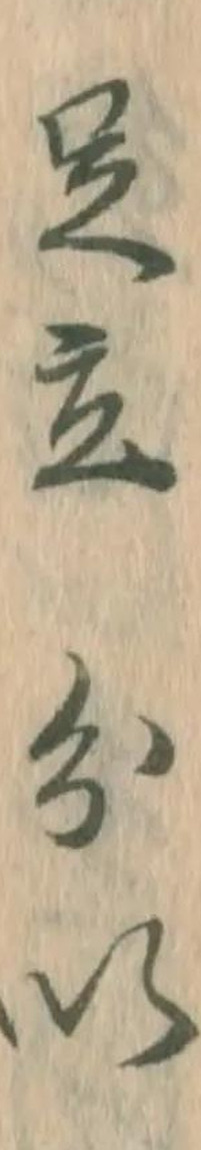足立分以
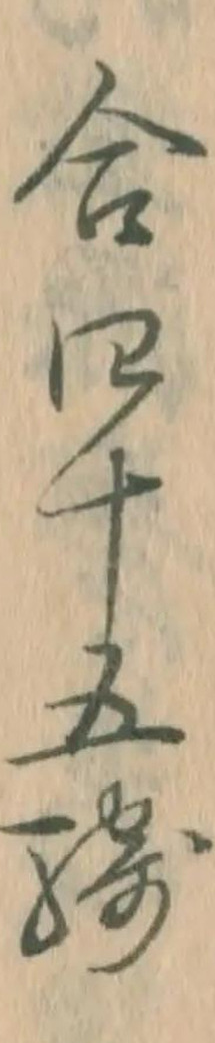合四十五騎

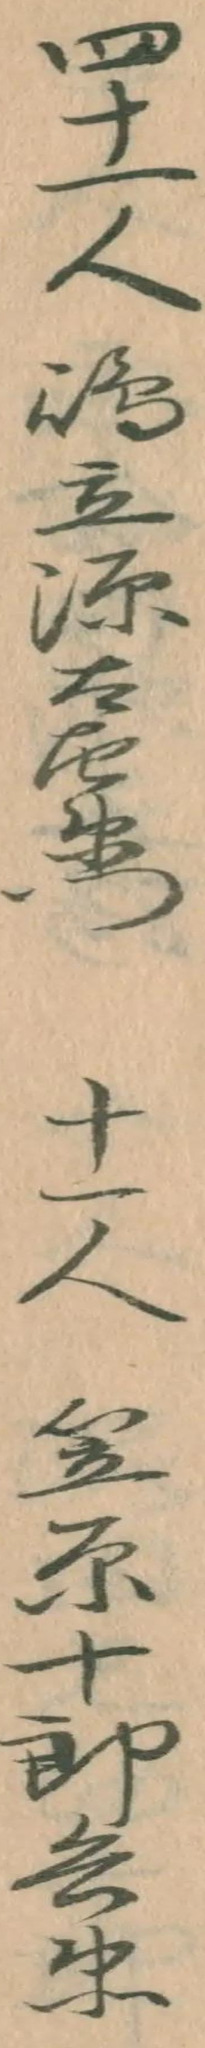四十一人島立源太左衛門十一人笠原十郎兵衛
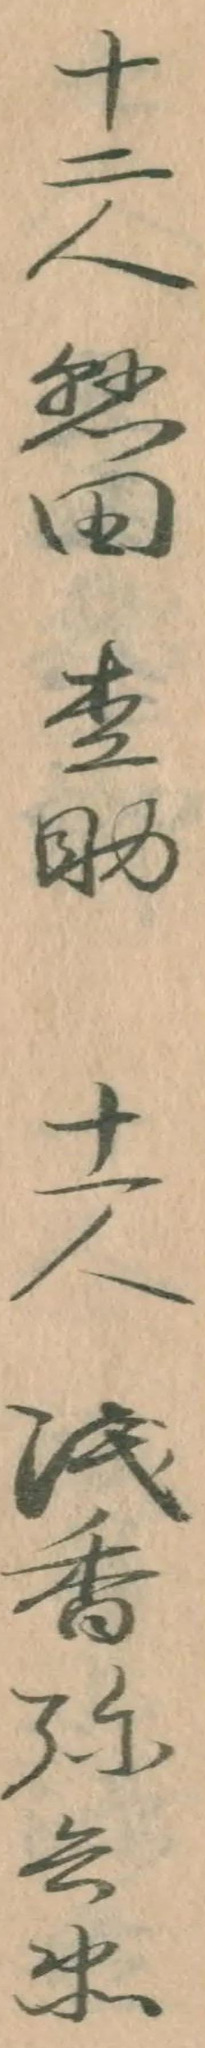十二人懸田杢助十一人浅香弥兵衛
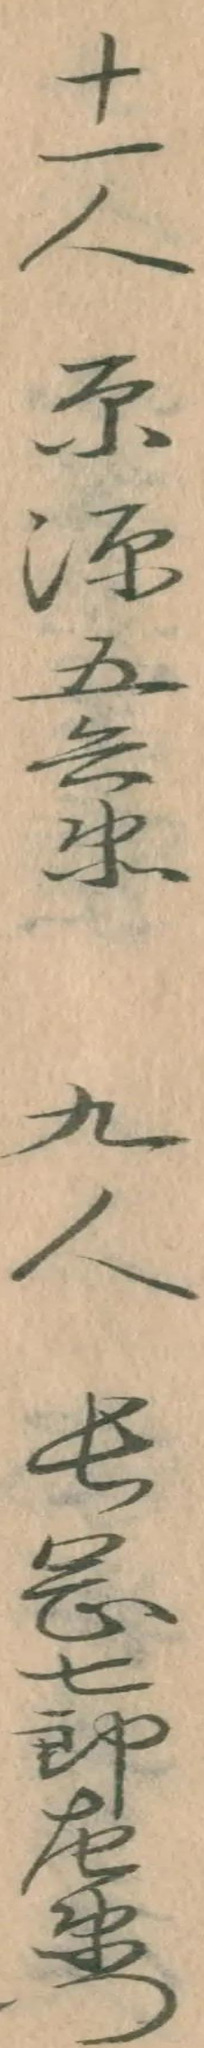十一人原源五兵衛九人長岡七郎左衛門
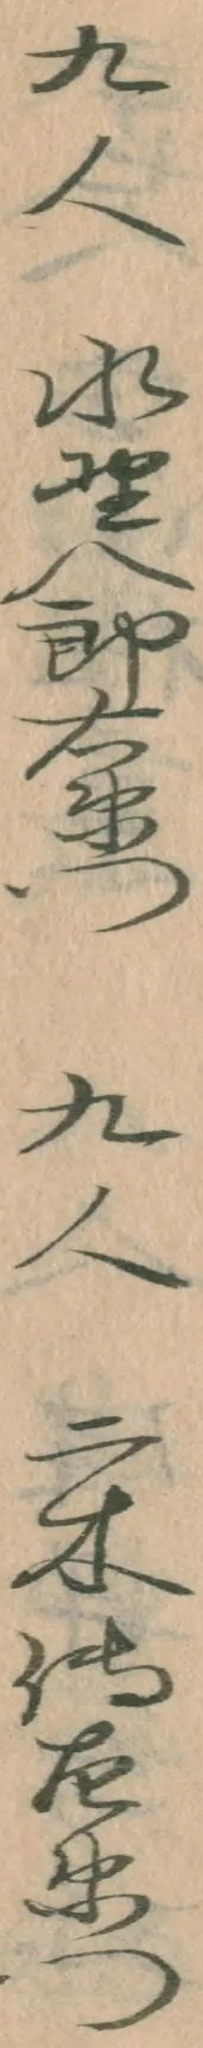九人水野八郎右衛門九人二木伝左衛門
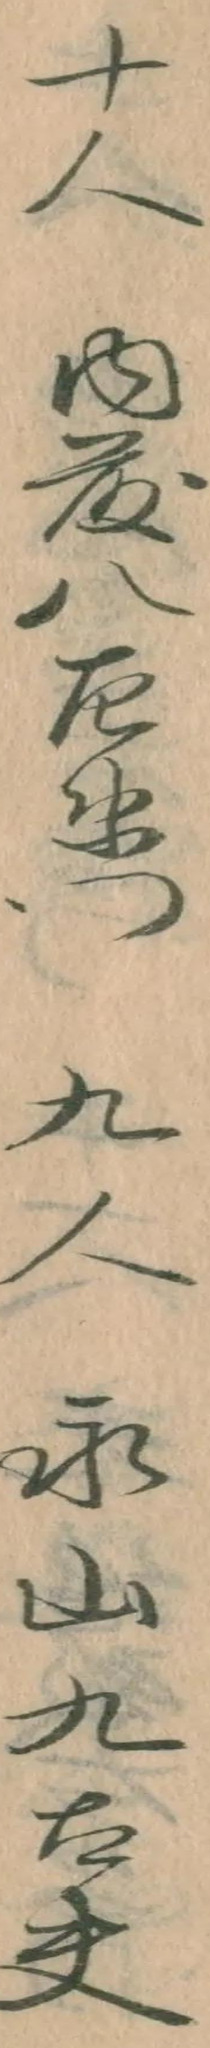十人内藤八左衛門九人永山九太夫
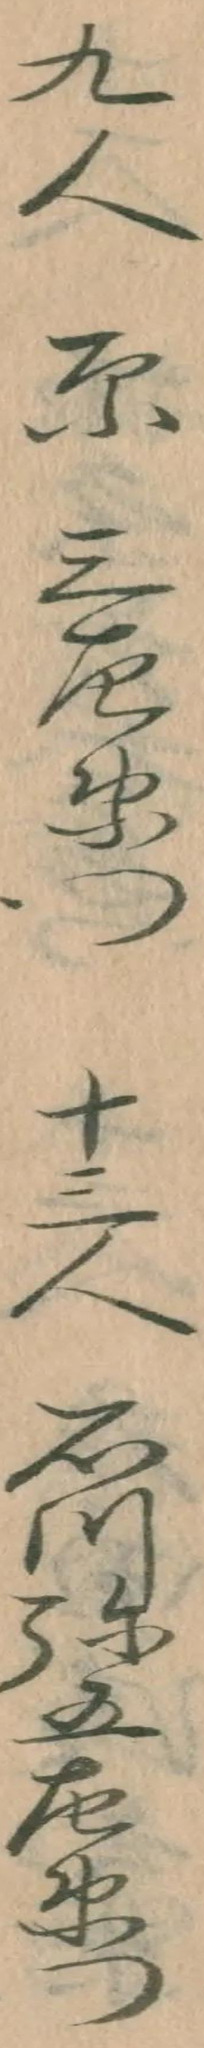九人原三左衛門十三人石川弥五左衛門
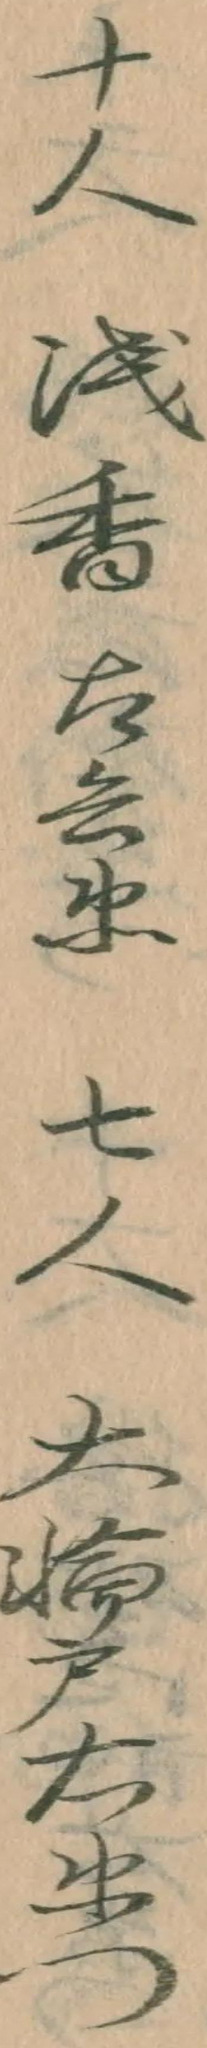十人浅香太兵衛七人大輪戸右衛門
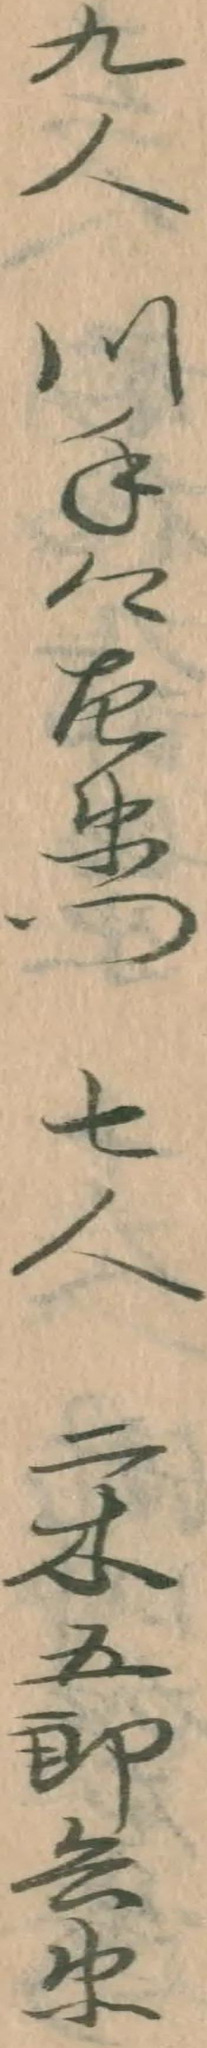九人川手郷左衛門七人二木五郎兵衛
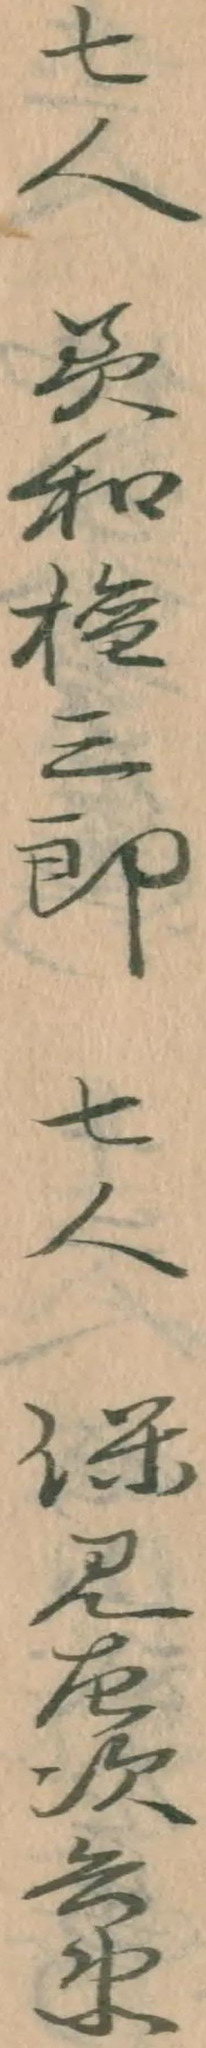七人美和権三郎七人保見左次兵衛
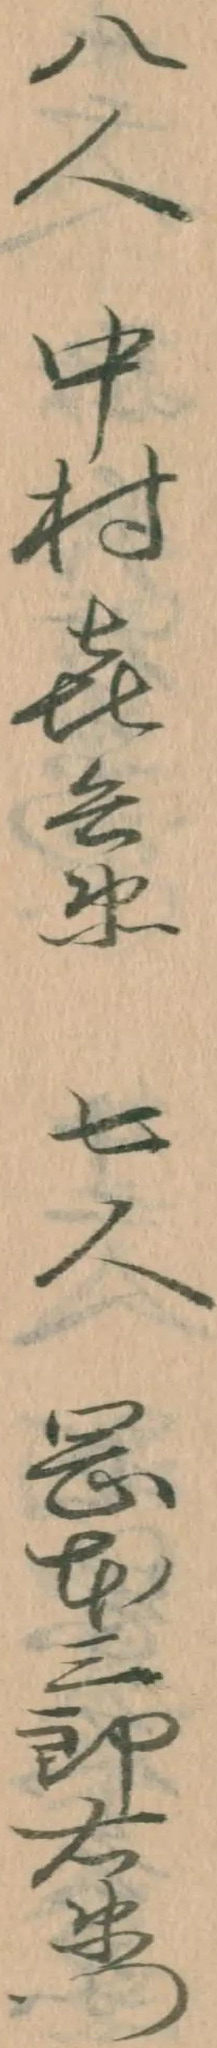八人中村喜兵衛七人岡本三郎右衛門
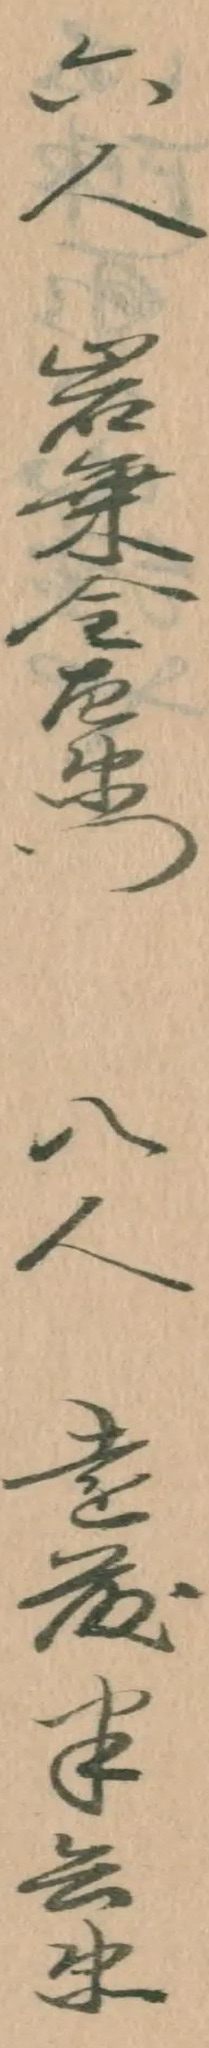六人岩乗金左衛門八人遠藤半兵衛
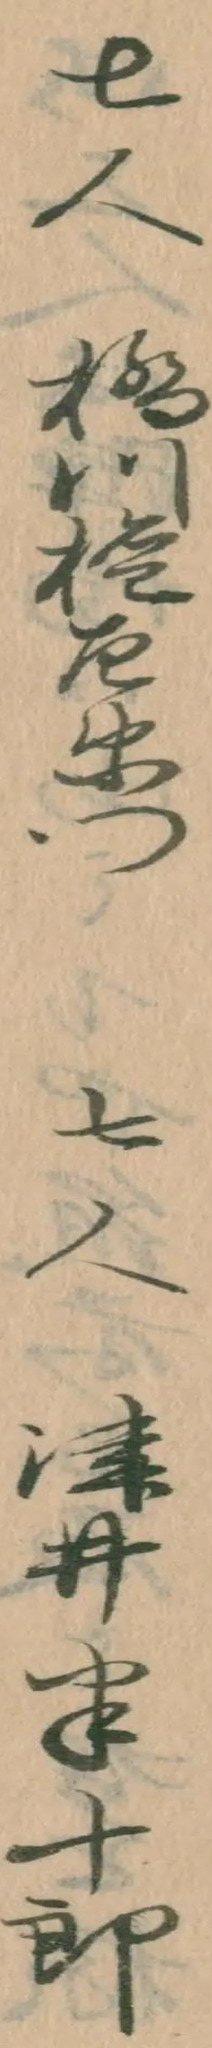七人橋川権左衛門七人津井半十郎
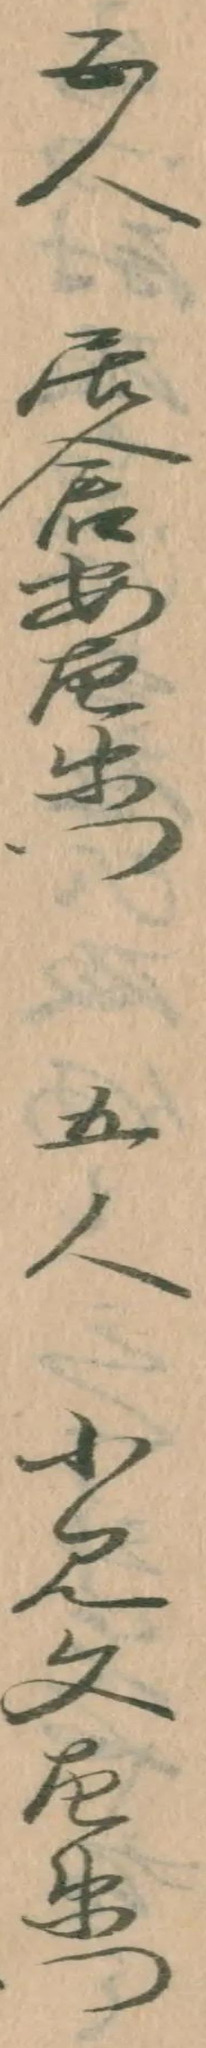五人居倉安左衛門五人小見文左衛門
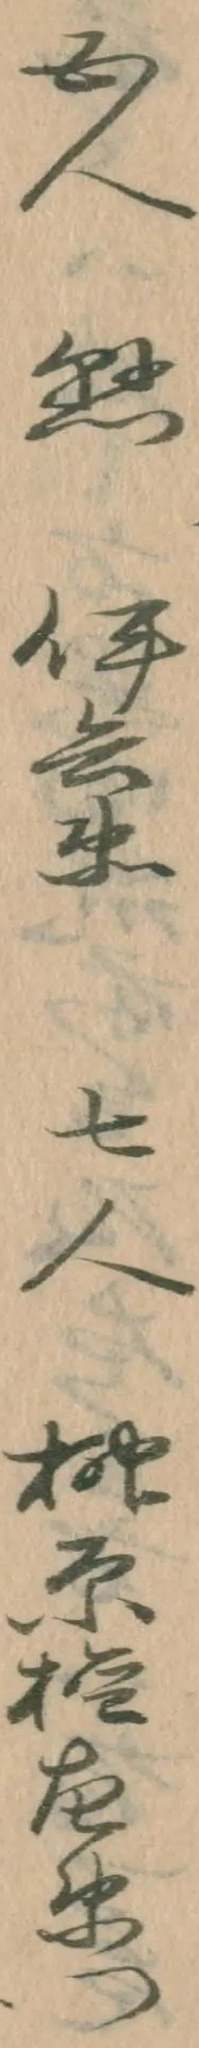五人懸伊兵衛七人榊原権左衛門
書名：切支丹御退治記 49巻. [6]
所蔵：国立国会図書館 National Diet Library, JAPAN
